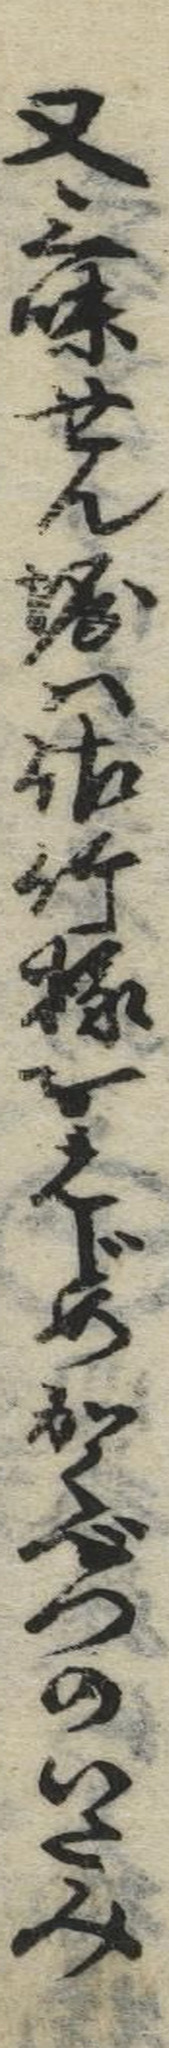又三味せん堀ハ佐竹様をはじめかくべつのいたみ
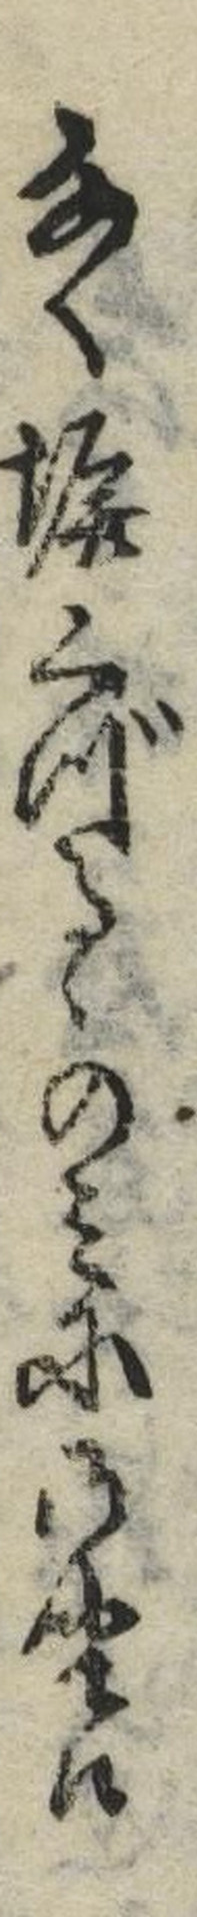なく堀くづるゝのミに御坐候
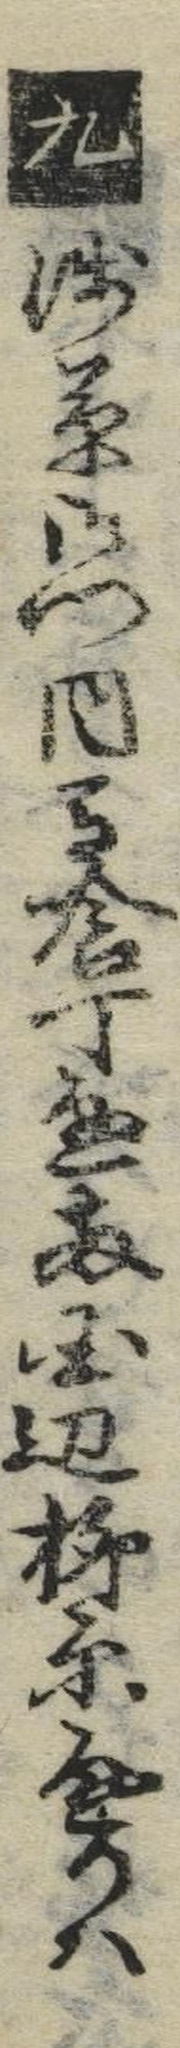九浅草御門内馬喰丁通両国辺柳原通りハ
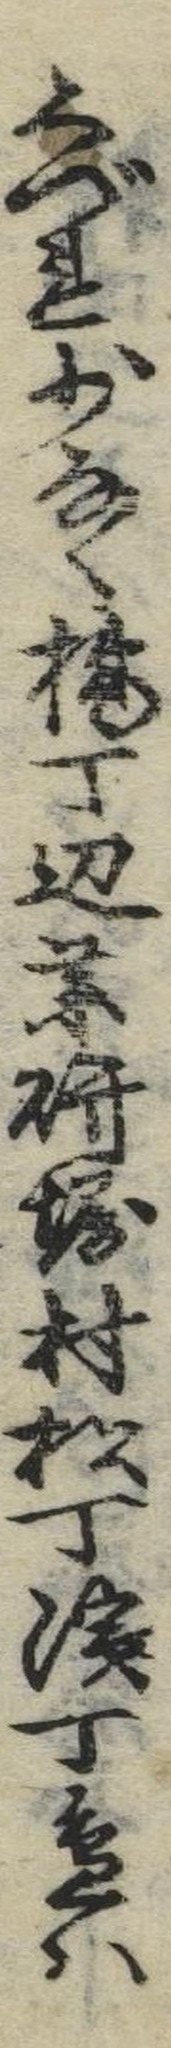くづれ少なく橋丁辺薬研掘村松丁浜丁辺ハ
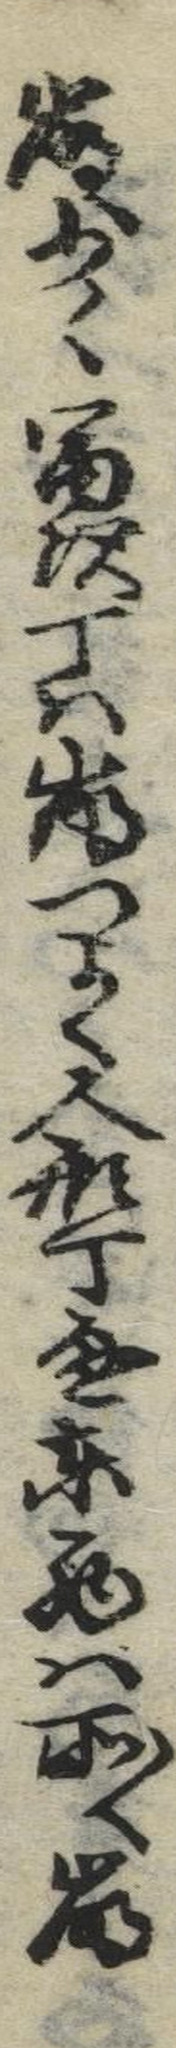崩少く富沢丁ハ崩つよく人形丁通東西ハ所々崩
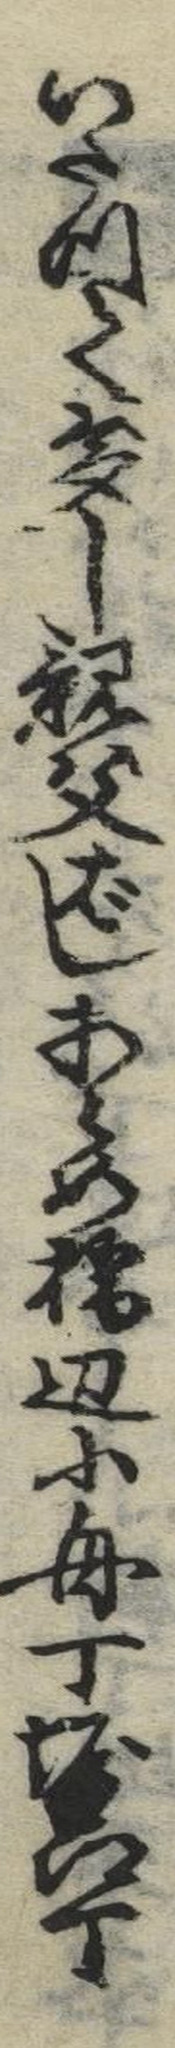いたつて多し親父ばしあらめ橋辺小舟丁堀江丁
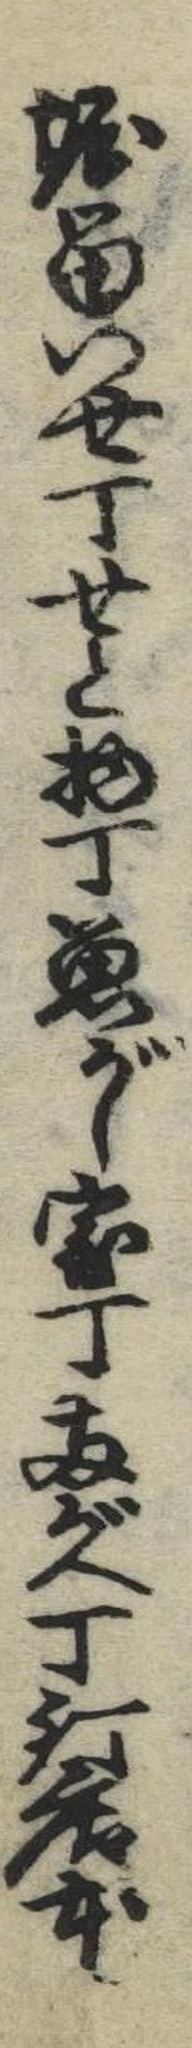掘留いせ丁せと物丁魚がし宝丁両がへ丁釘店本
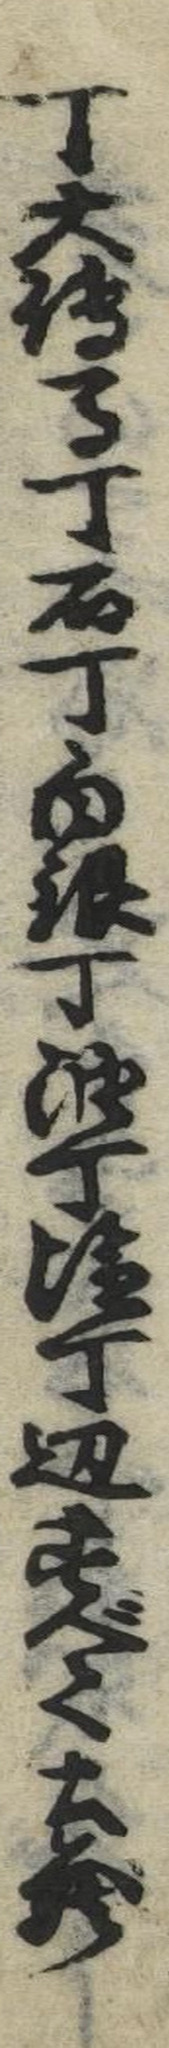丁大伝馬丁石丁白銀丁油丁塩丁辺すべて土蔵

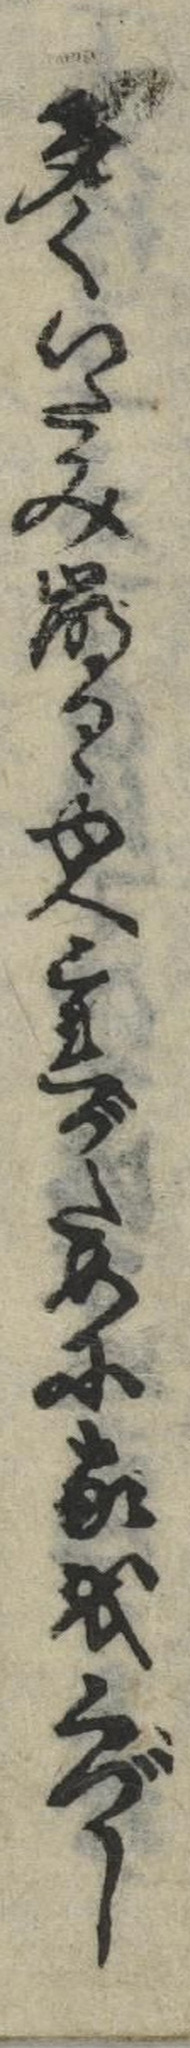多くいたみ崩るゝゆへこれがために家をくづし
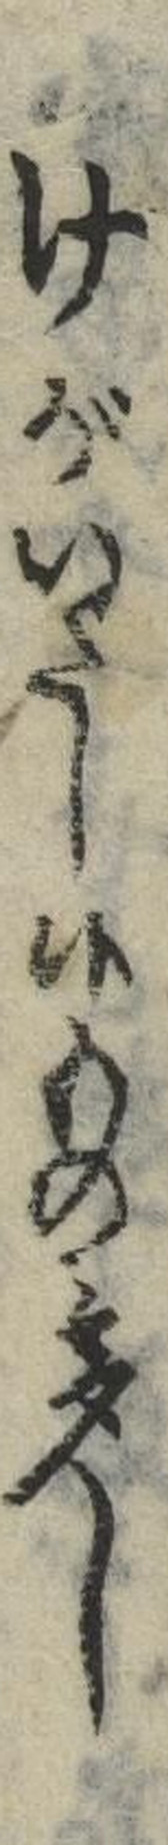けがいたし候もの多し
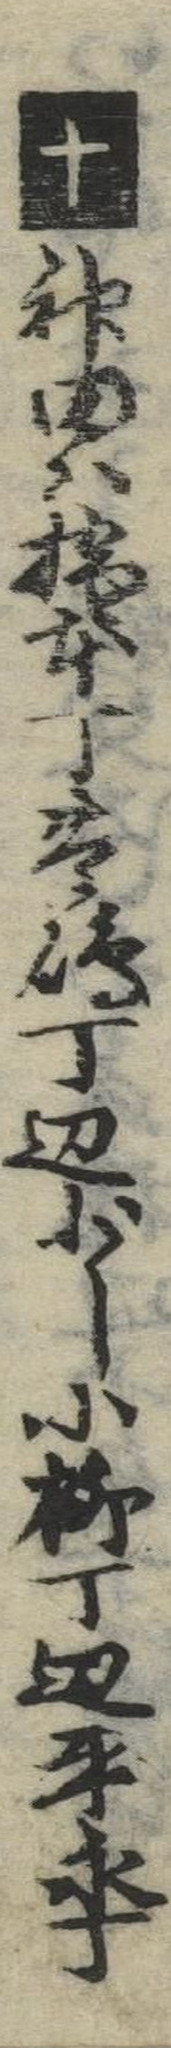十神田ハ橋本丁堂嶋丁辺少し小柳丁辺平永
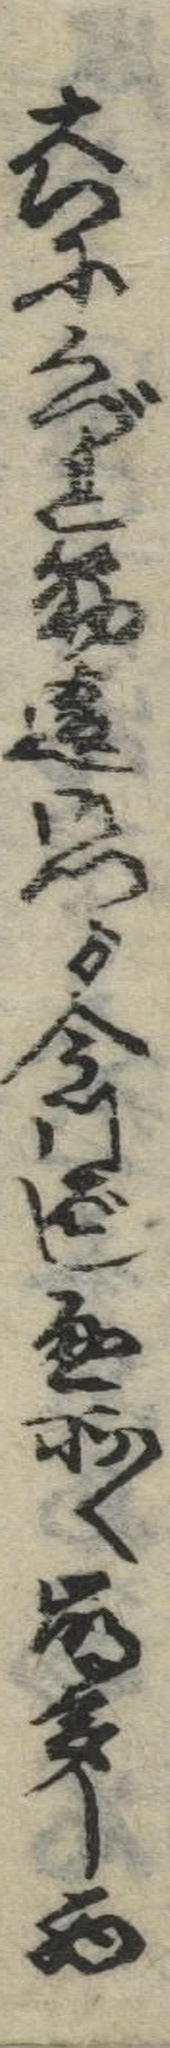大いにくづれ筋違御門ゟ今川ばし通所々崩多し西
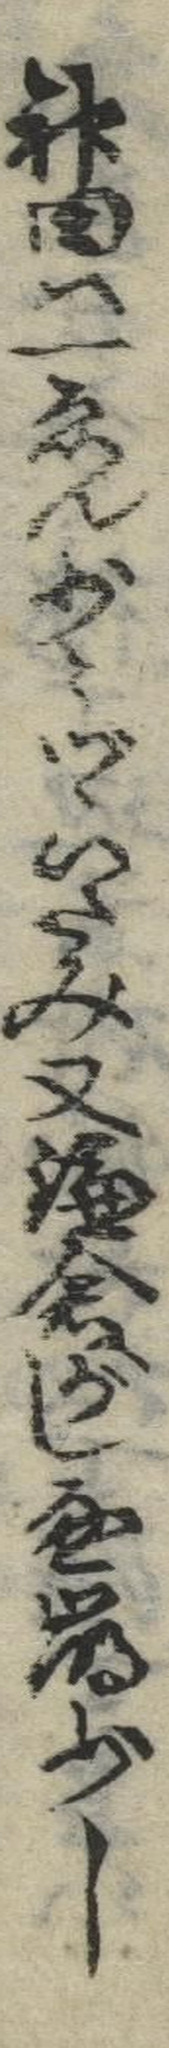神田ハ一ゑん少々ツゝいたみ又輪倉ばし通崩少し
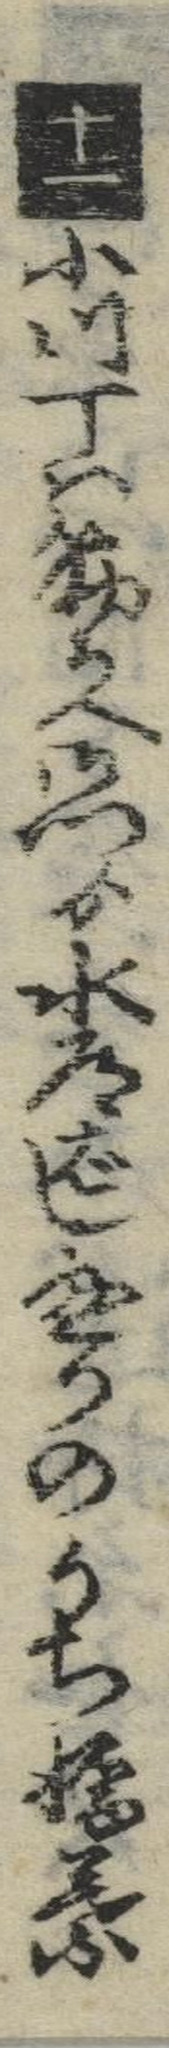十一小川丁ハ筋かへ御門ゟ水道ばし通りのうち稲葉
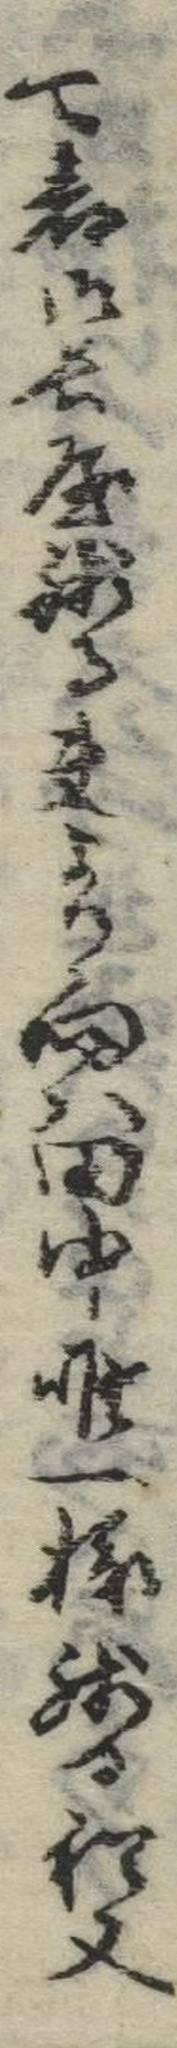て表御長屋残る夫より向ハ田中唯一様残る猶又
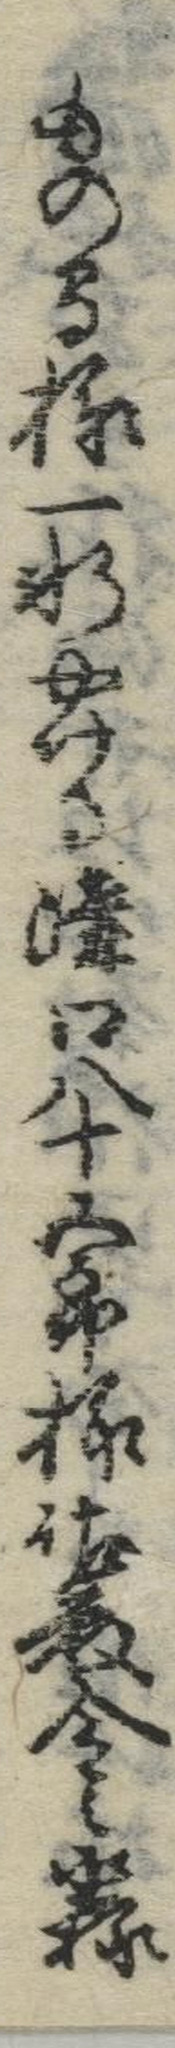もの守様一軒やける溝口八十五郎様佐藤金兵衛様
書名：安政二卯十月二日夜四ツ時過　御府内御屋敷方市中共　地震類焼場所明細書之寫　并街道筋近郷聞書
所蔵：東京大学地震研究所図書室 Earthquake Research Institute Library, The University of Tokyo, JAPAN
